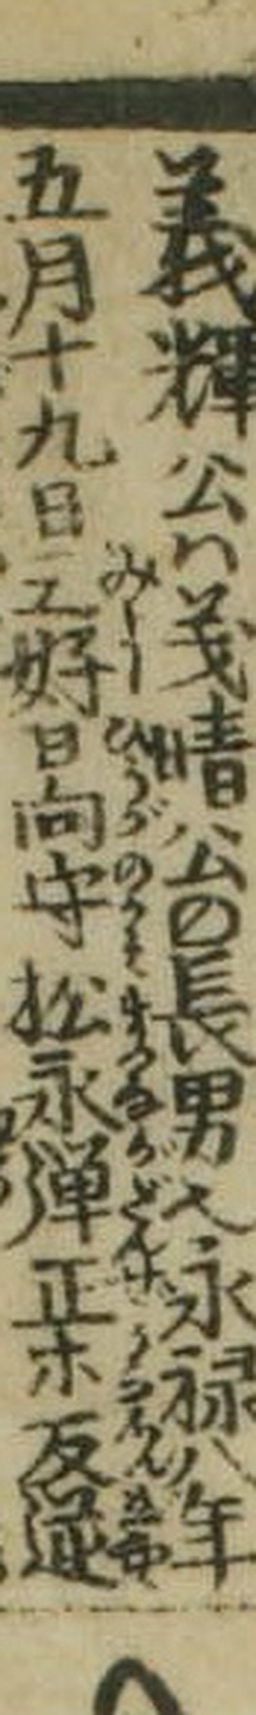五月十九日三好日向守松永弾正等反逆
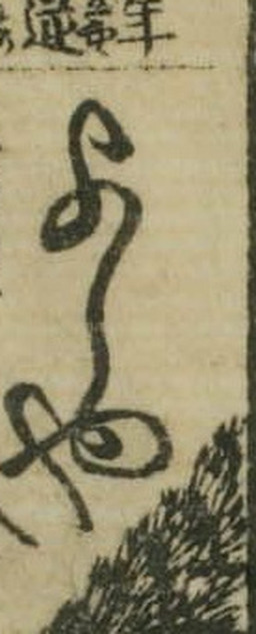よしや
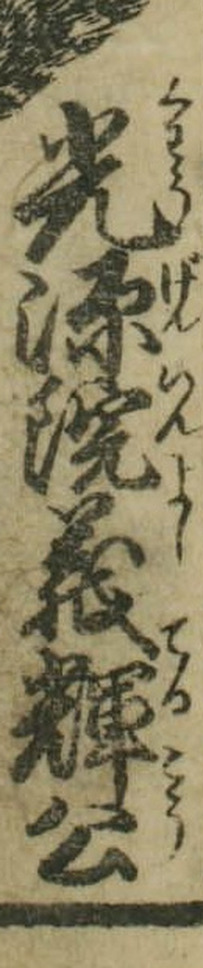光源院義輝公
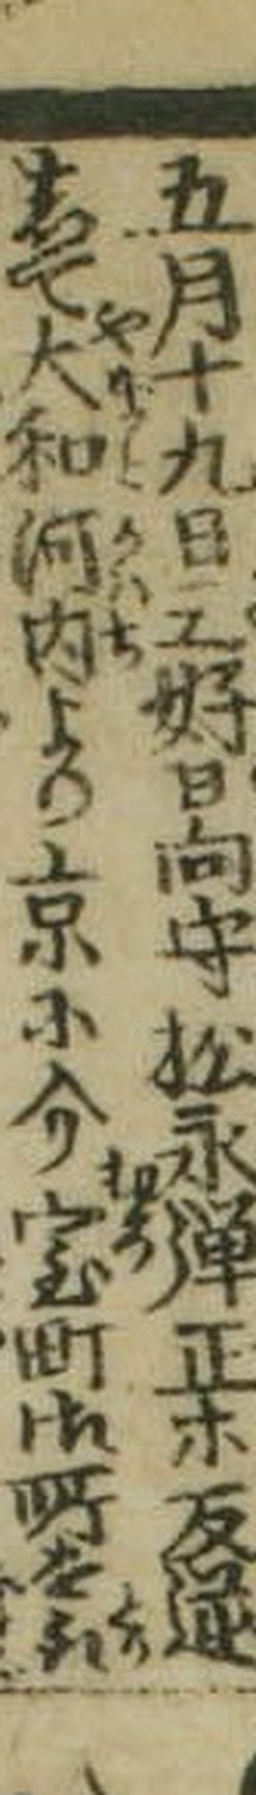して大和河内より京に入り室町御所を取
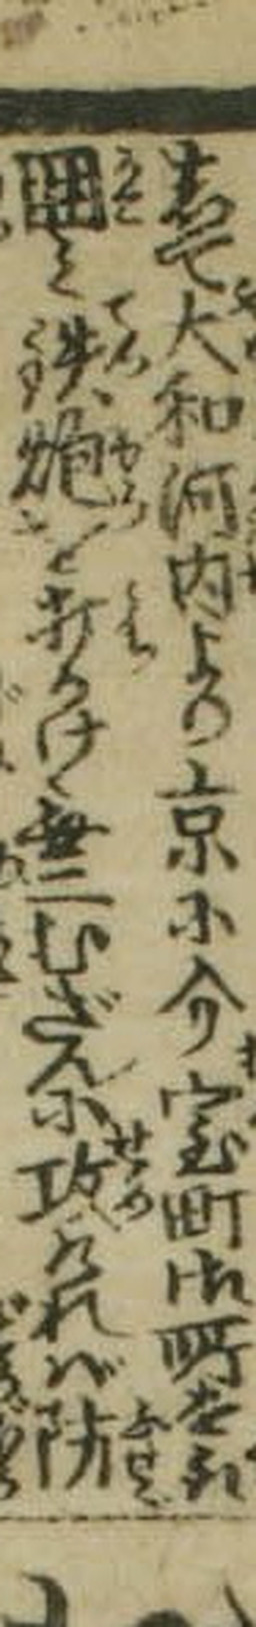囲み鉄砲を打かけ無二むざんに攻ければ防
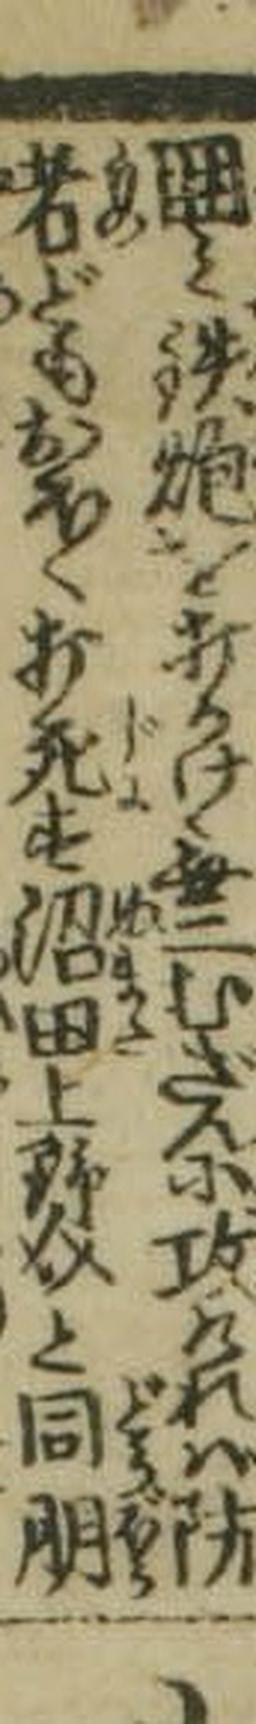者どもおほく打死す沼田上野介と同朋
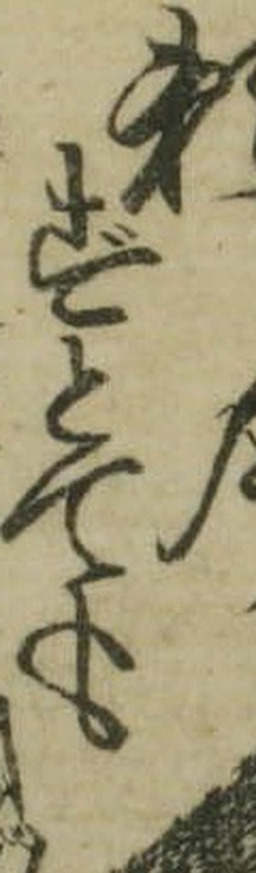ずとても
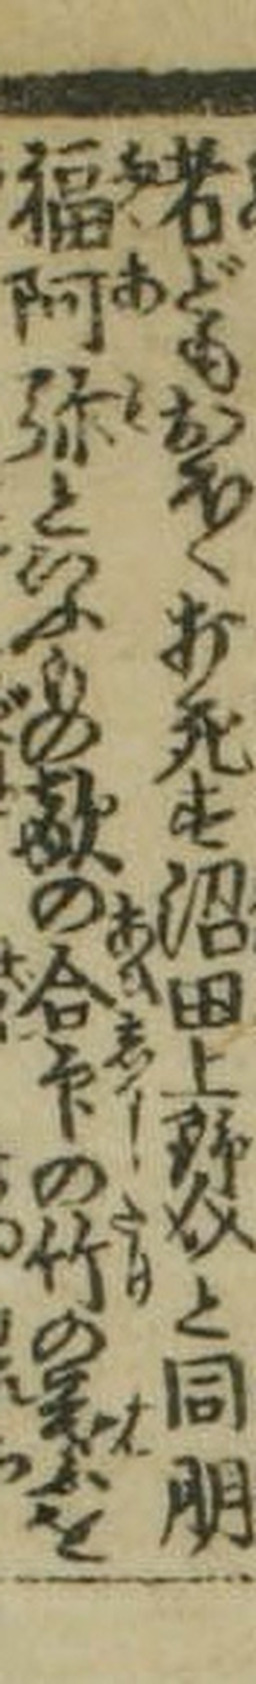福阿弥といふもの敵の合印の竹の葉を
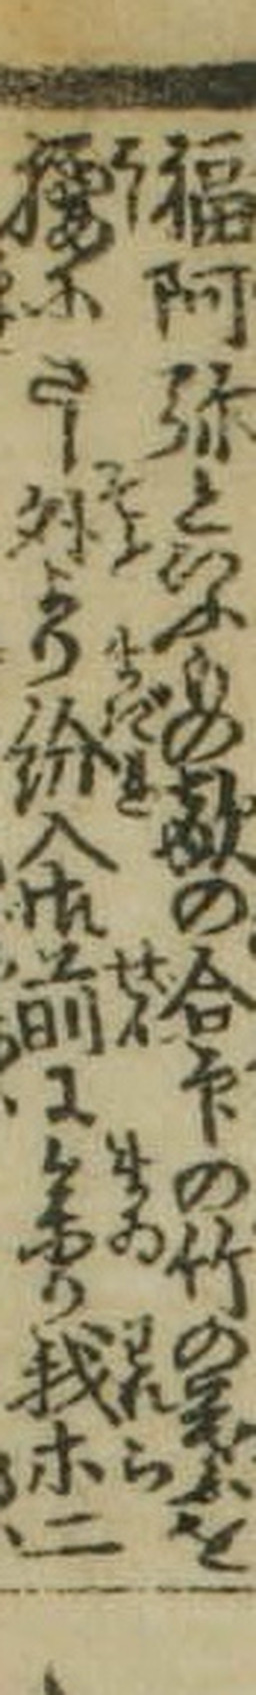腰にさし外より紛入御前に参り我等二
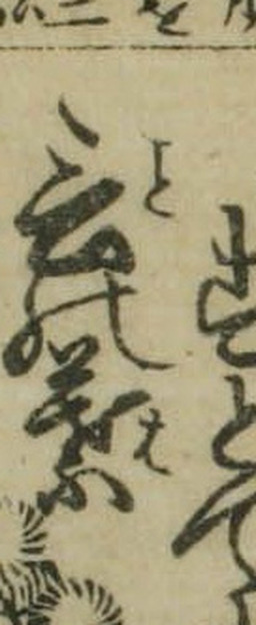言の葉
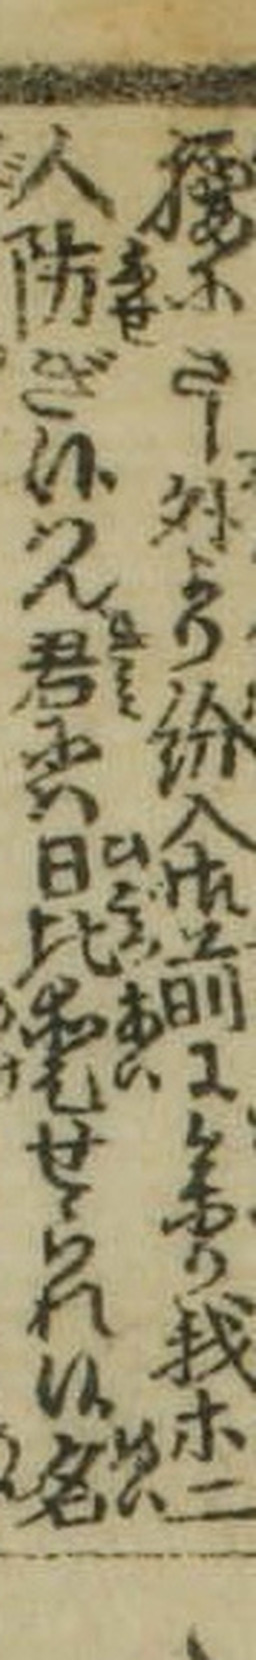人防ぎ候はん君には日頃愛せられ候名
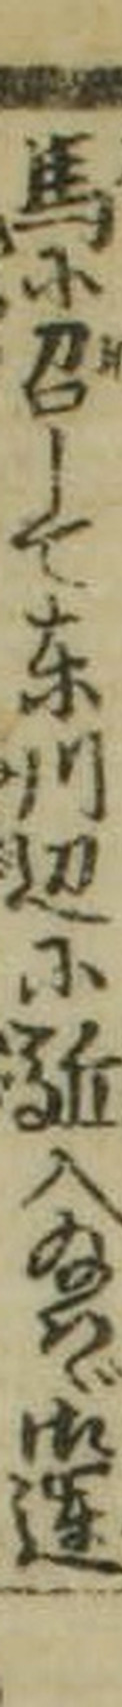馬に召して東川辺に駈入給はゞ御運
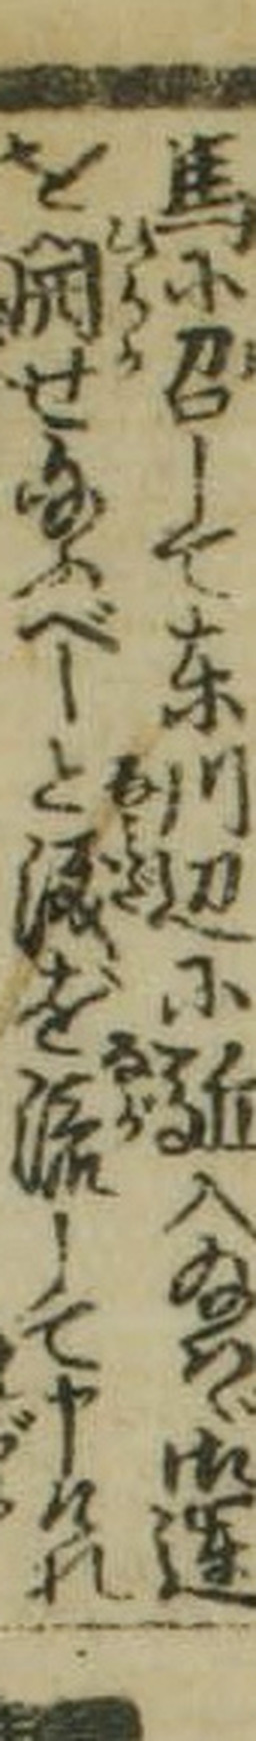を開せ給ふべしと涙を流して申けれ
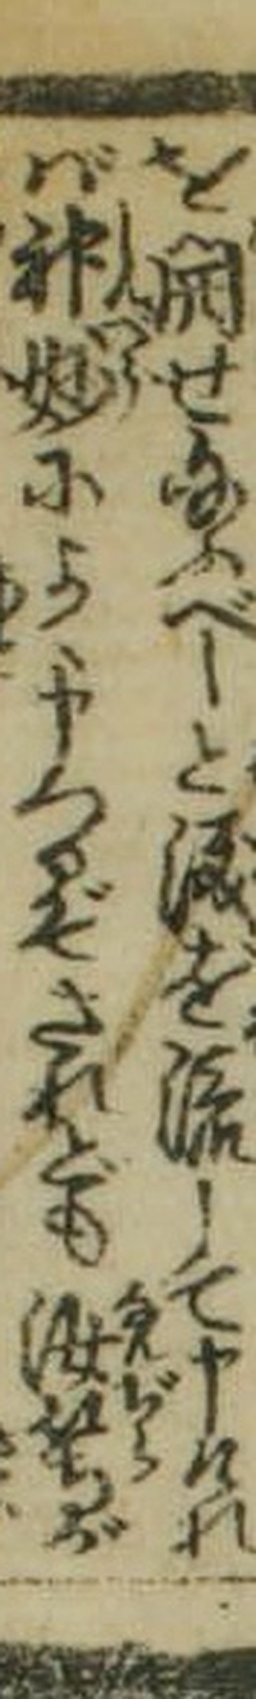ば神妙によく申つるぞされども汝等が
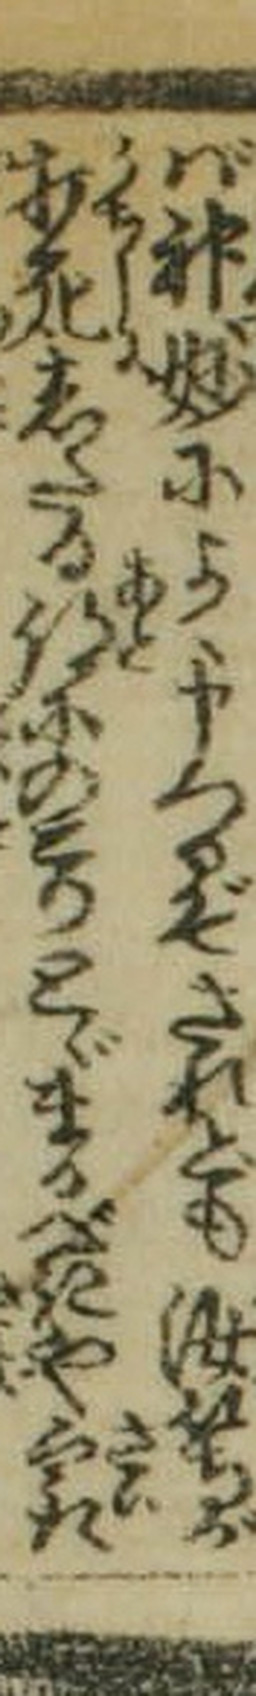打死したる跡にのこりとゞまるべきや最
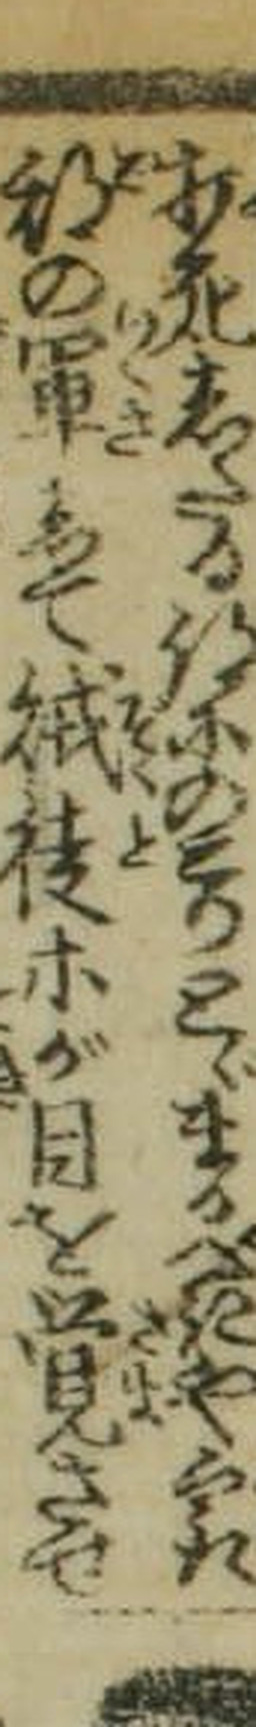期の軍して賊徒等が目を覚させ
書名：續英雄百人一首
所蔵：東京学芸大学附属図書館
